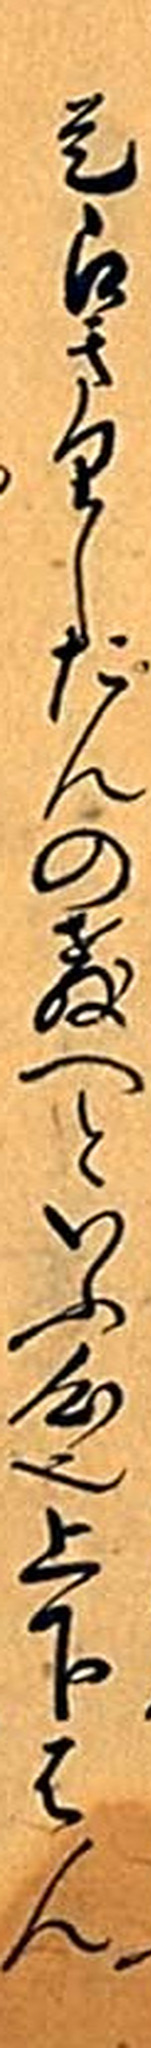是即きりしたんの教へといふ心也上下はん
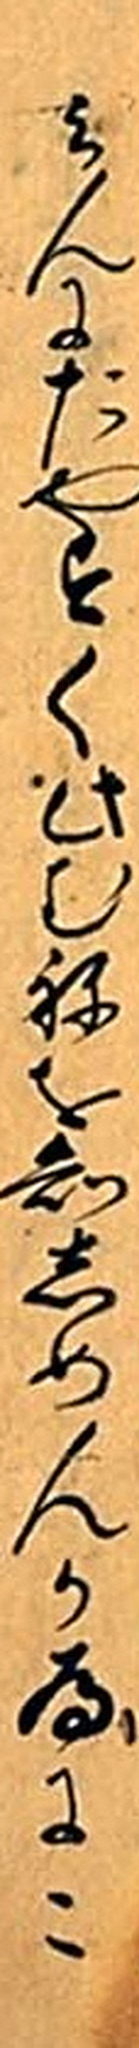みんにたやすく此むねを知しめんか為にこ
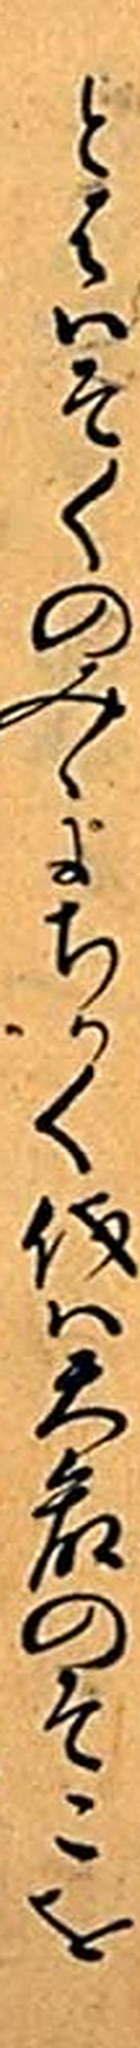とははそくのみゝにちかく儀は天命のそこを
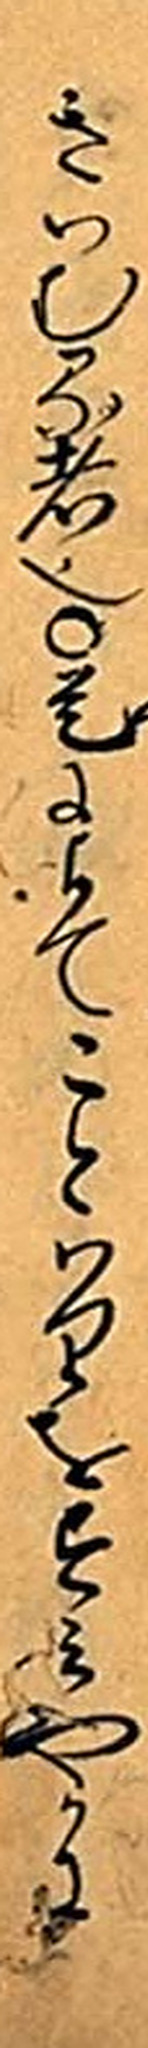きはむる者也○是によてことはりをすみやかに
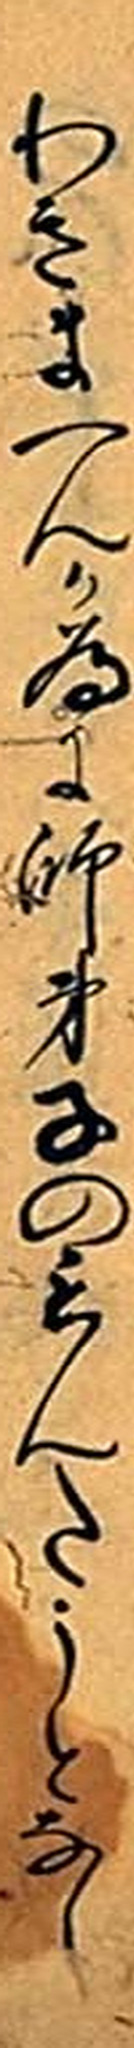わきまへんか為に師弟子のもんたうとなし
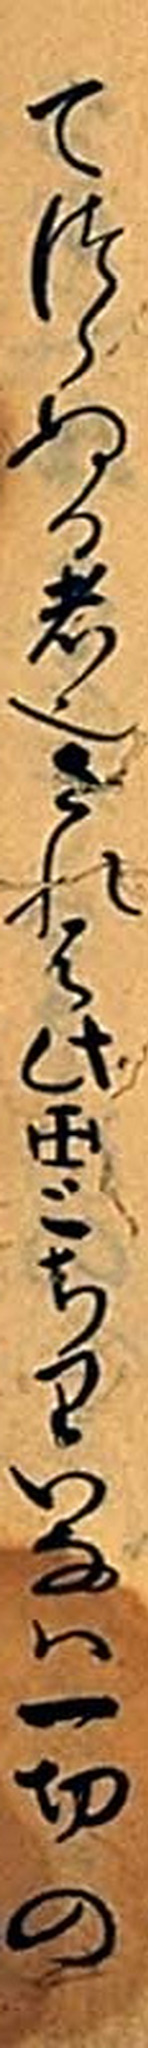てつらぬる者也されは此☩とちりいなは一切の
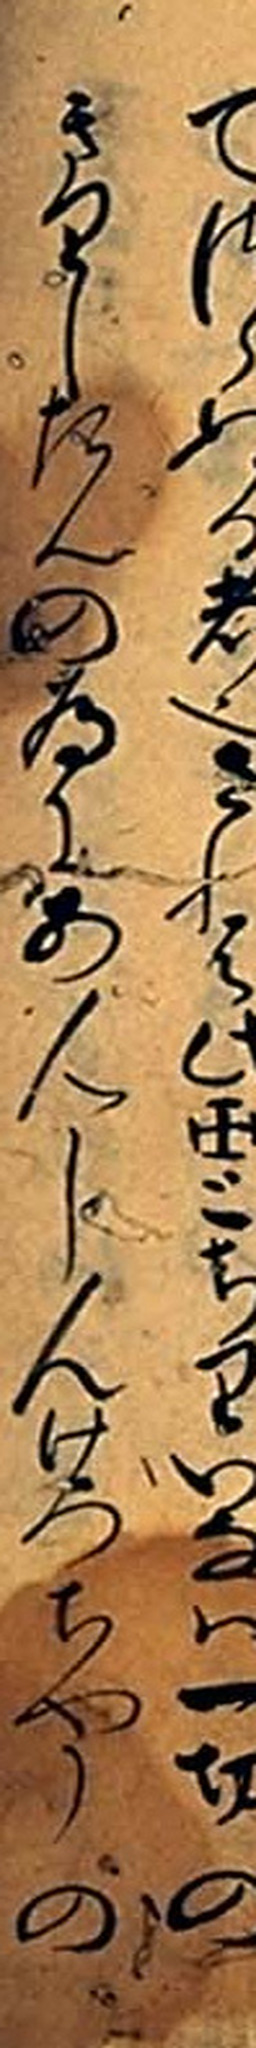きりしたんの為にあんしんけつちやうの

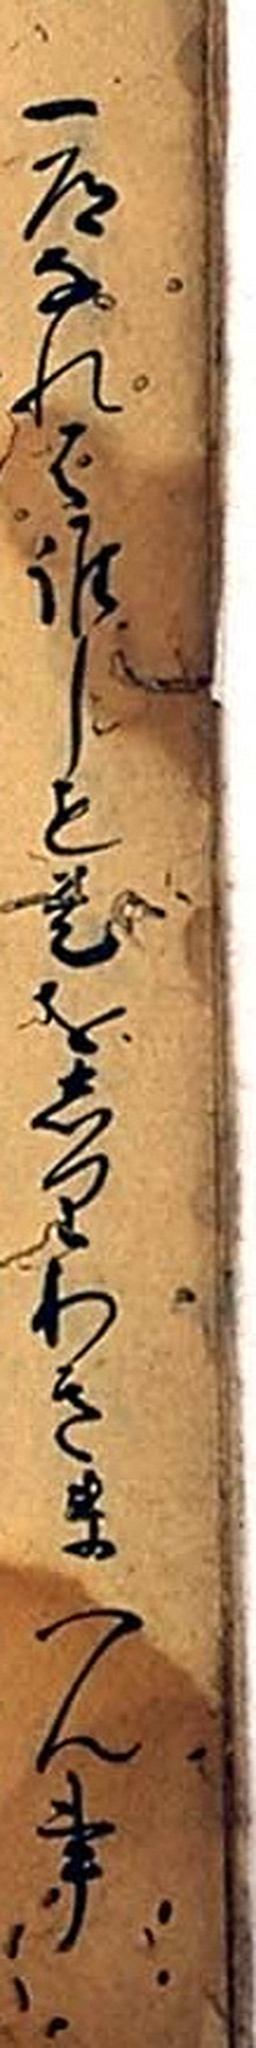一道なれは誰しも是をしりわきまへん事
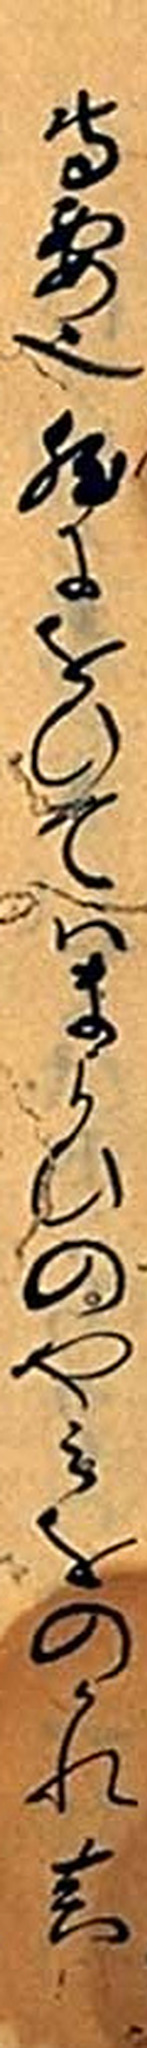専要也然にをひてはまかひのやみをのかれ真
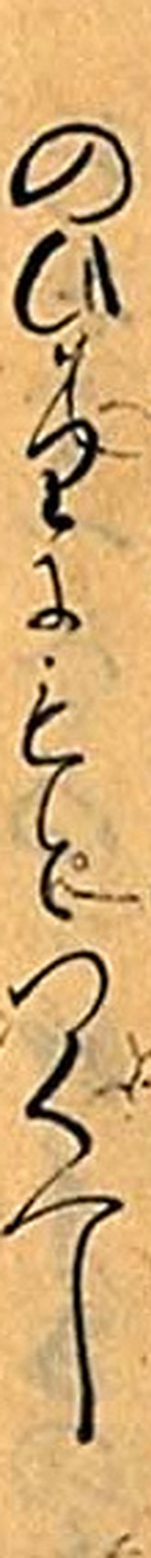のひかりにもとつくへし
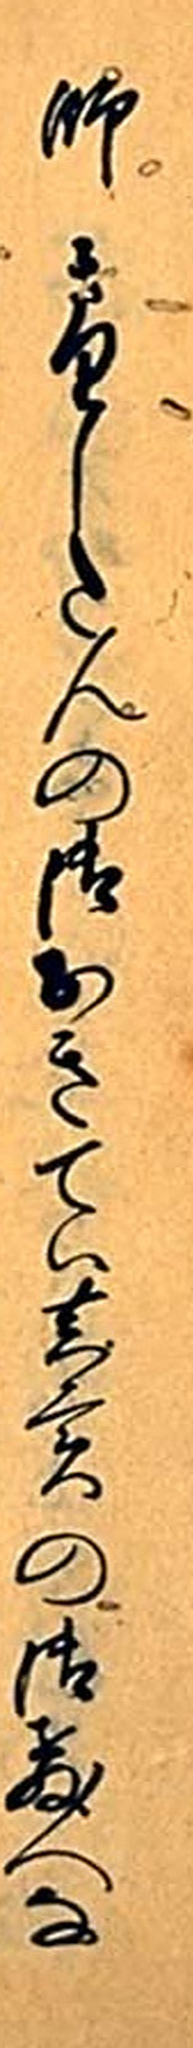師きりしたんの御おきては真実の御教へな
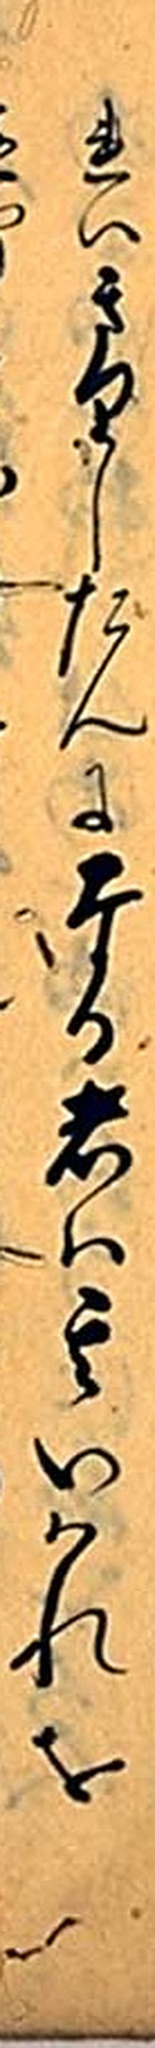れはきりしたんになる者は其いはれを
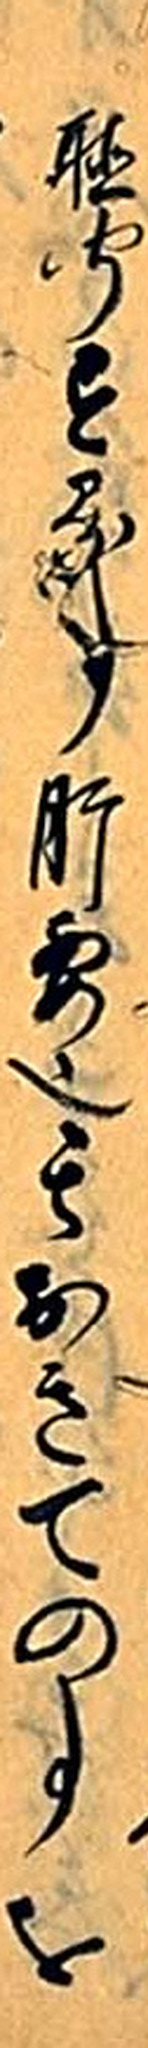聴聞する事肝要也其おきての事を
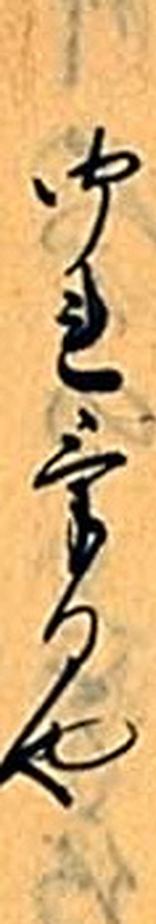聞れけるや
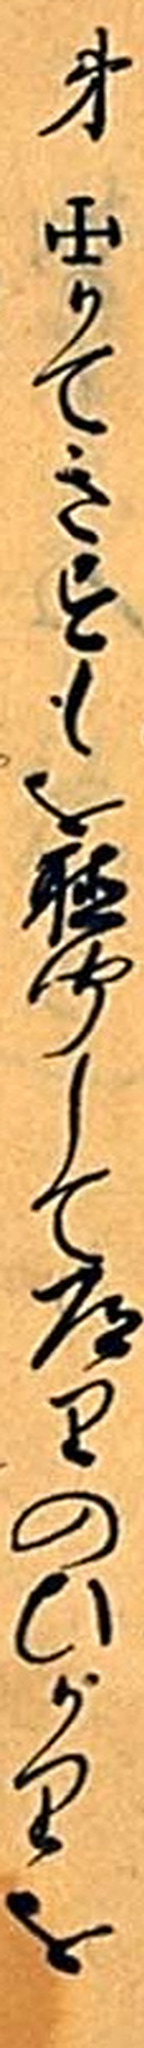弟☩かてきすもを聴聞して道里のひかりを
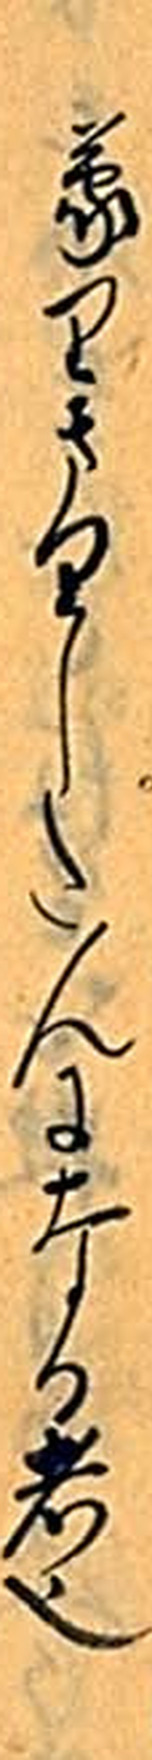蒙りきりしたんになる者也
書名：ドチリナ・キリシタン
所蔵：東京大学総合図書館 / General Library in the University of Tokyo
